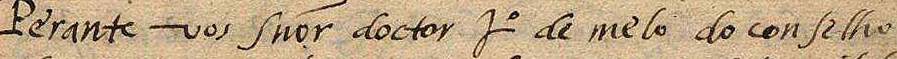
Perante vos sno̅r doctor Jo de melo do conselho
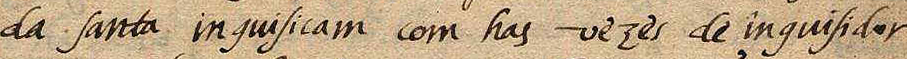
da santa inquisicam com has vezes de inquisidor
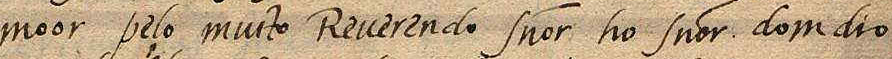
moor pelo muito Reuerendo sno̅r ho sno̅r dom dio
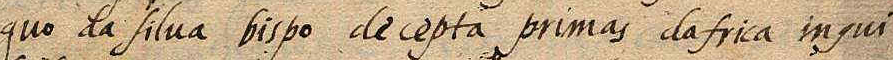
guo da silua bispo de cepta primas dafrica inqui
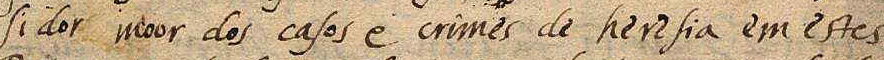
sidor moor dos casos e crimes de heresia em estes
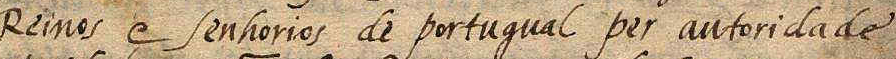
Reinos e senhorios de portugual per autoridade
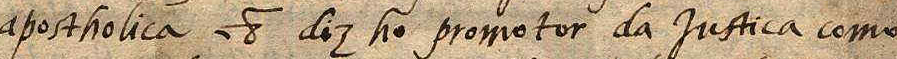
apostholica et̅ diz ho promotor da Justica como
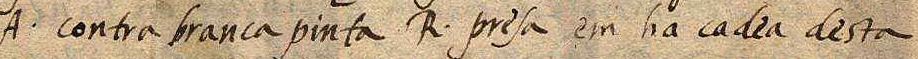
A. contra branca pinta R. presa em ha cadea desta
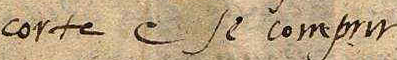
corte e se comprir
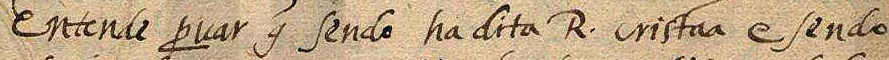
Entende ꝓuar q̅ sendo ha dita R. cristãa e sendo
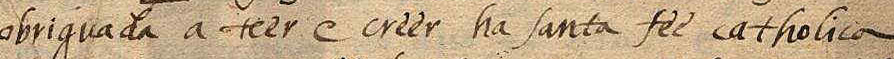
obriguada a teer e creer ha santa fee catholica
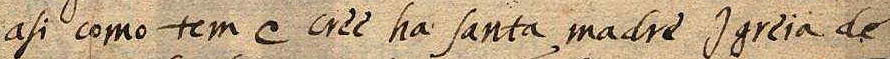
asi como tem e cree ha santa madre Jgreia de
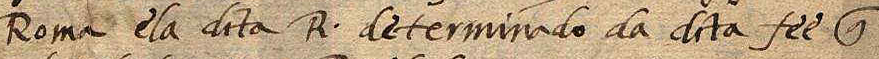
Roma ela dita R. determin̄ado da dita fee q̅
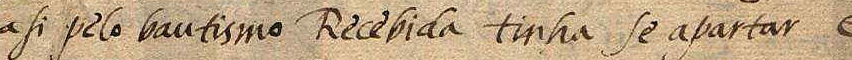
asi pelo bautismo Recebida tinha se apartar e
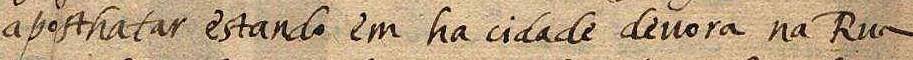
aposthatar estando em ha cidade deuora na Rua
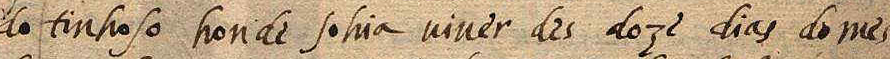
do tinhoso honde so hia uiuer des doze dias do mes
